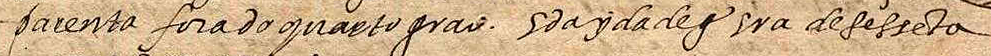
parenta fora do quarto grao. E da ydade q̄ Era de sessēta
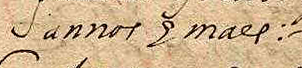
annos E maes:
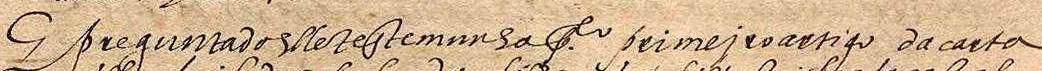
E preguntado Elle testemunha p.lo primejro artigo da carta
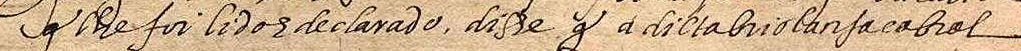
q̄ lhe foi lido E declarado, disse q̄ a dicta briolanja cabral
